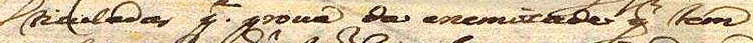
ticuladas pa. proua da enemizade q̄ tem
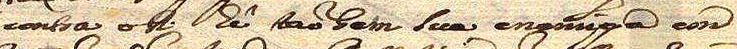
contra o R. he taõbem sua enemiga em
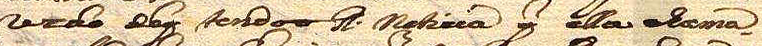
rezão de q̄ tendo o R. noticia q̄ ella chama
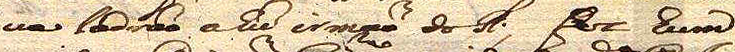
ua ladrão a hū irmaõ do R. fez hum
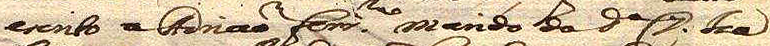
escrito a Adriaõ ferr.ra marido da da D. Iza
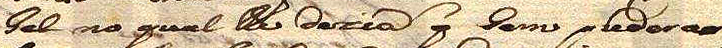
bel no qual lhe deziā q̄ bem pudera
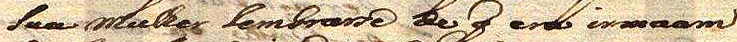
sua mulher lembrarse de q̄ era irmam
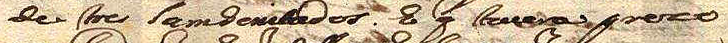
de tres sambenitados. E q̄ teuera prezo
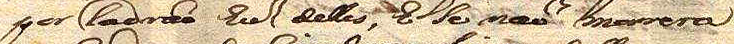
por ladrão hū delles, E se naõ morrera
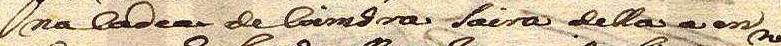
na Cadea de Coimbra saira della a en
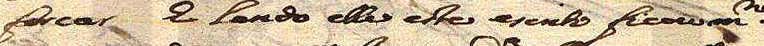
forcar E lendo elle este escrito ficou mto.
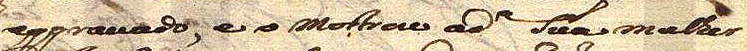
aggravado, e o mostrou a da sua molher
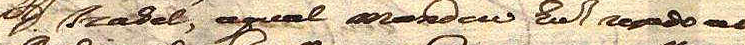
D. Izabel, a qual mandou hū recado ao
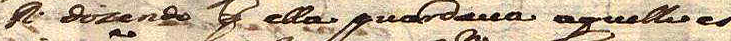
R. dizendo q̄ ella guardaua aquelle es
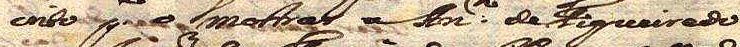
crito pa o mostrar a Anto. de Figueiredo
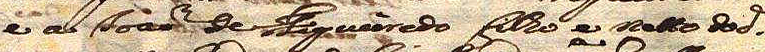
e a Ioaõ de Figueiredo filho e netto do d.o
